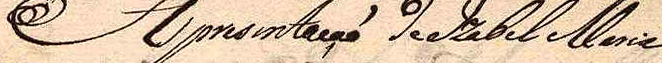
Apresentaçaõ de Izabel Maria
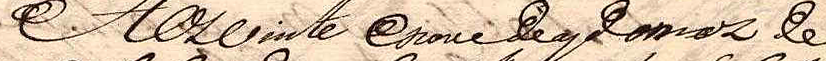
Aoz vinte e noue dias do mez de
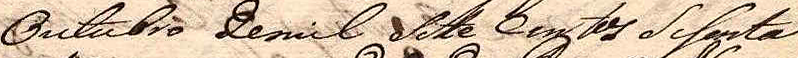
Outubro de mil settecentos sesenta
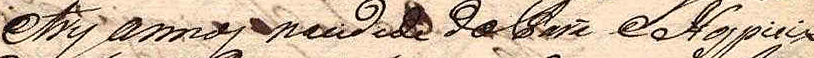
e tres annos na cidade do Parà e Hospicio
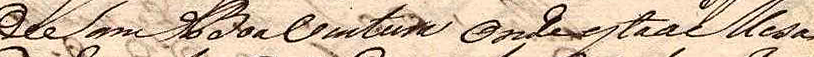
de Sam Boaventura onde esta a Mesa
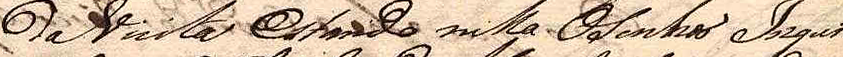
da Vizita estando nella O Senhor Inqui
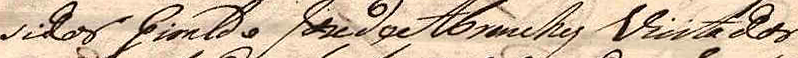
sidor Giraldo Joze de Abranches Visitador
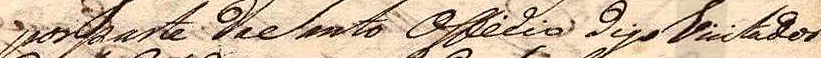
por parte do Santo Officio digo Visitador
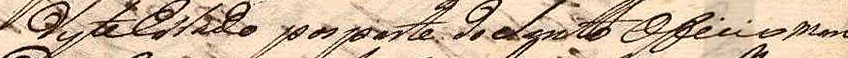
deste Estado por parte do Santo Officio man
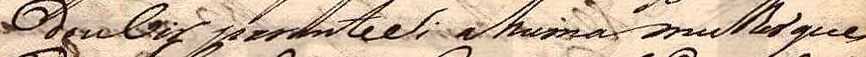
dou Vir perante si a huma mulher que
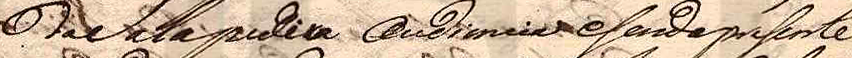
da sala pedira audiencia e sendo presente
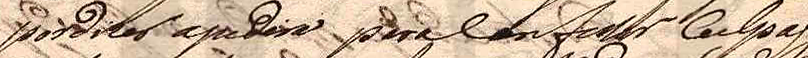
por dizer a pedira para confessar Culpas
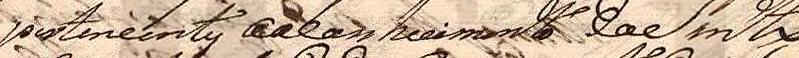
pertencentes ao conhecimento do Santo
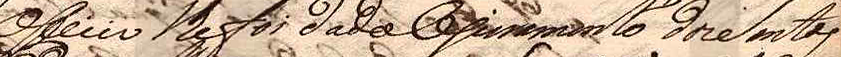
Oficio lhe foi dado O juramento doz Santos
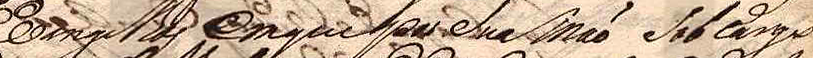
Evangelhos em que pos Sua maõ sobcargo
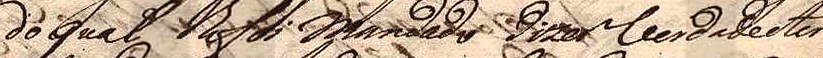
do qual lhe foi mandado dizer verdade e ter
